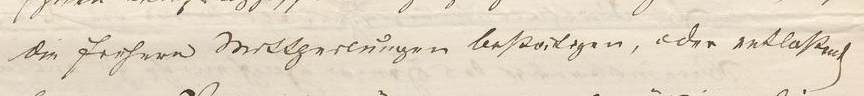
die frühern Mittheilungen bestätigen, oder entlastend
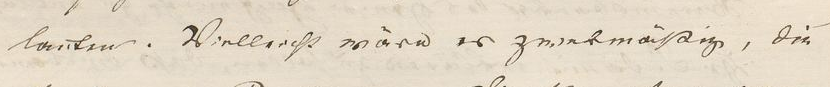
lauten. Vielleicht wäre es zwekmäßig, die
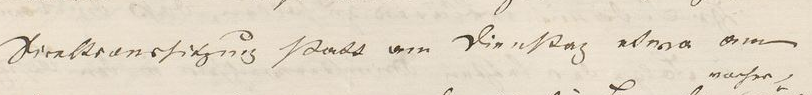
Direktionssitzung statt am Dienstag etwa am
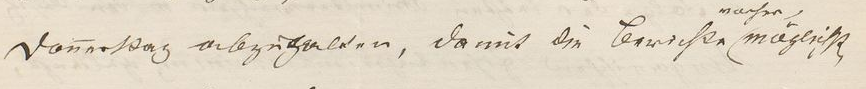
Donnerstag abzuhalten, damit die Berichte vorher möglichst
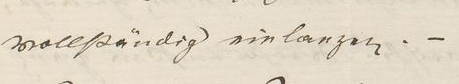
vollständig einlangen. –
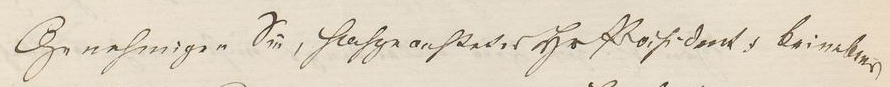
Genehmigen Sie, hochgeachgteter Hr Präsident, beinebens
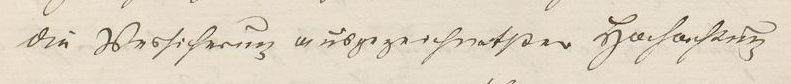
die Versicherung ausgezeichnetster Hochachtung
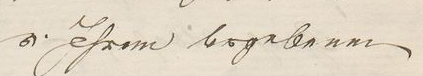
v. Ihrem ergebenen
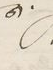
J.
